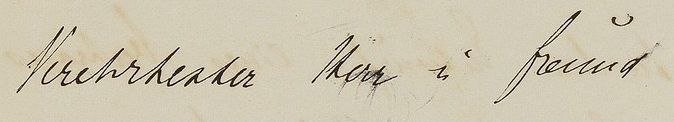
Verehrtester Herr u Freund
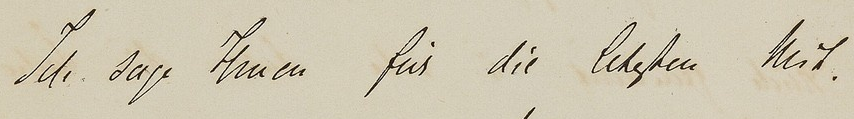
Ich sage Ihnen für die letzten Mit-
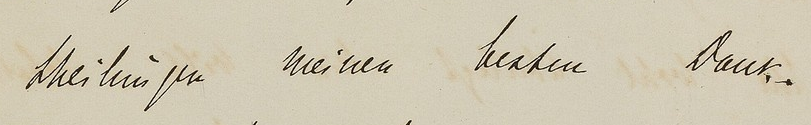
theilungen meinen besten Dank.
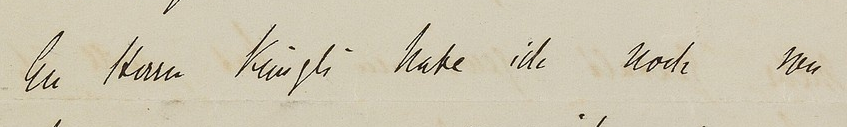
An Herrn Künzli habe ich noch von
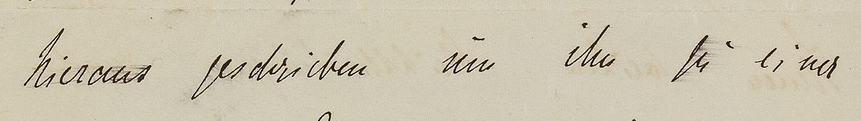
hieraus geschrieben um ihn zu einer
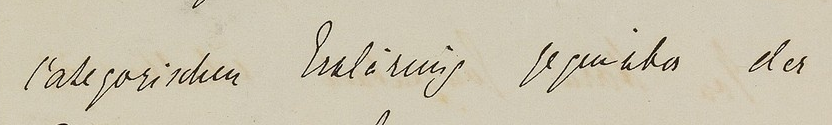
categorischen Erklärung gegenüber der
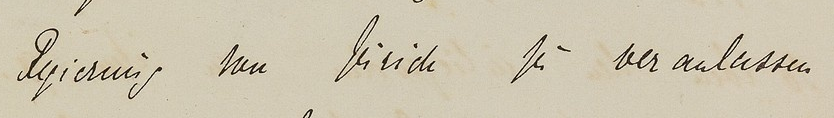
Regierung von Zürich zu veranlassen
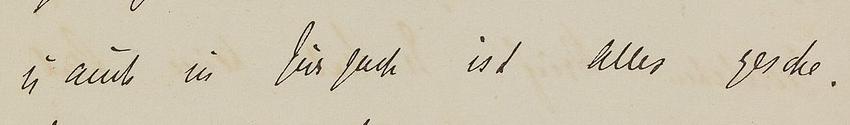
u auch in Zurzach ist alles gesche-
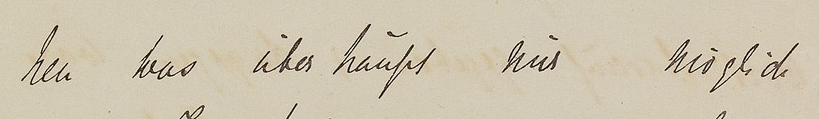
hen was überhaupt nur möglich
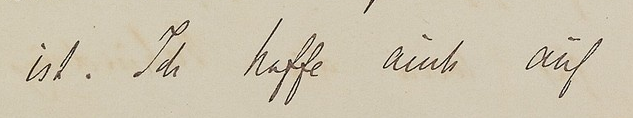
ist. Ich hoffe auch auf
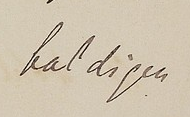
baldigen
